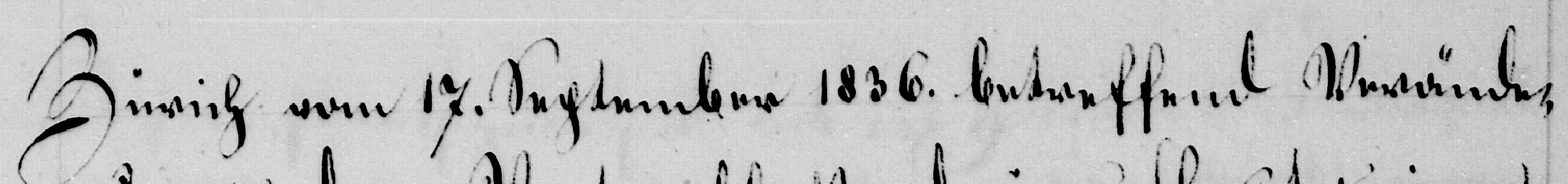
Zürich vom 17. September 1836. betreffend Verände¬
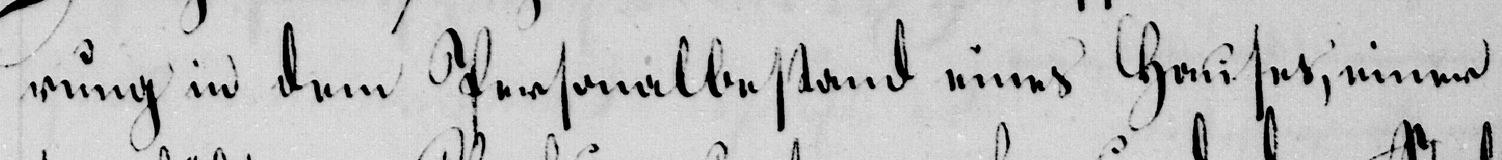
rung in dem Personalbestand eines Hauses, einer
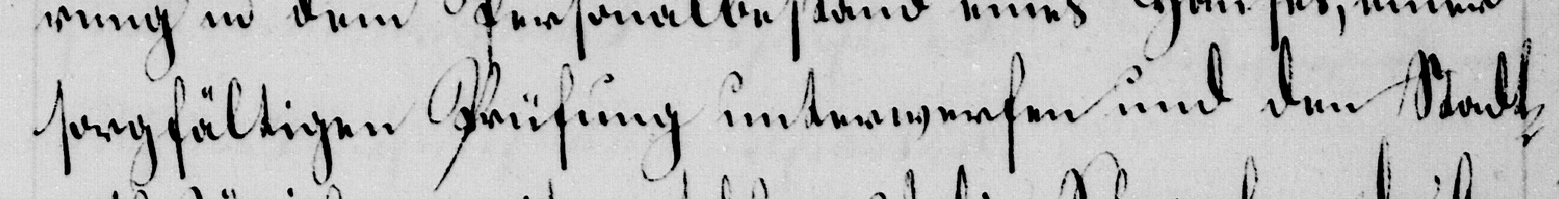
sorgfältigen Prüfung unterwerfen und den Stadt¬
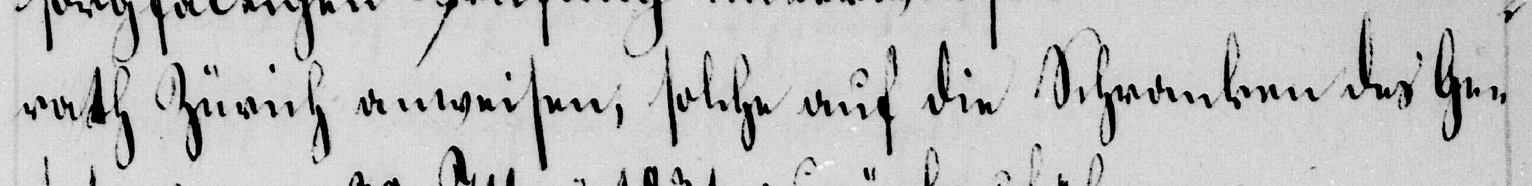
rath Zürich anweisen, solche auf die Schranken des Ge¬
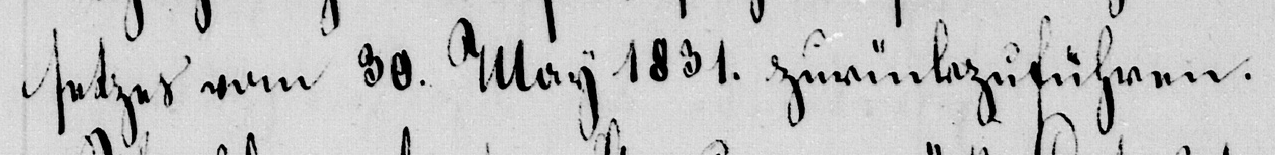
setzes vom 30. May 1831. zurückzuführen.
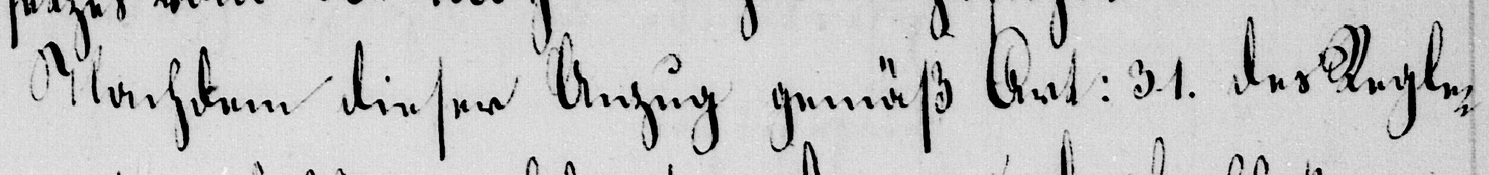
Nachdem dieser Anzug gemäß Art: 31. des Regle¬
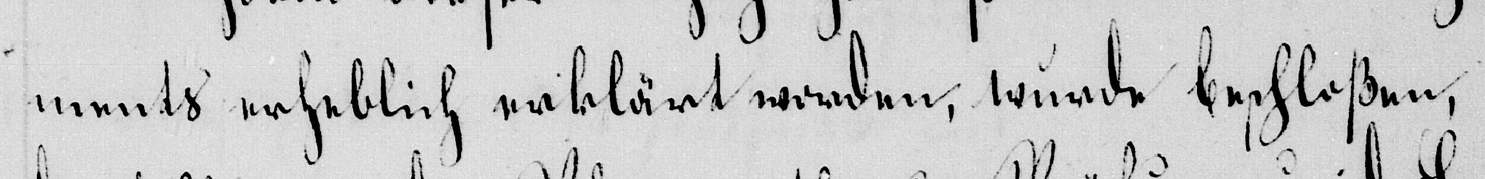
ments erheblich erklärt worden, wurde beschloßen,
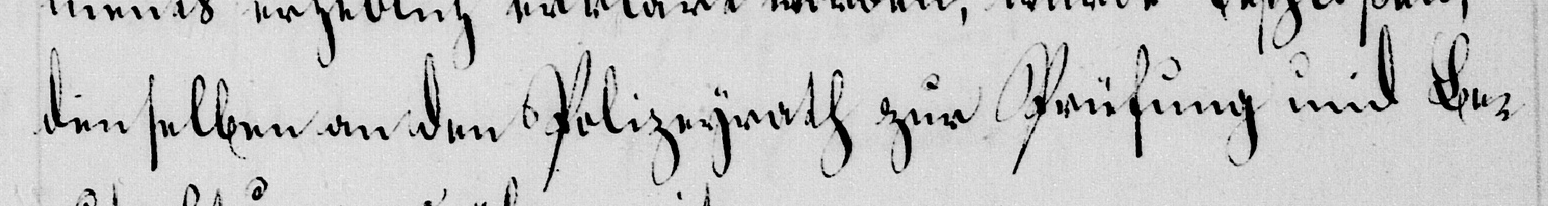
dieselben an den Polizeyrath zur Prüfung und Be¬
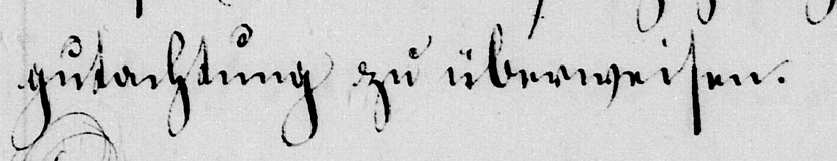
gutachtung zu überweisen.
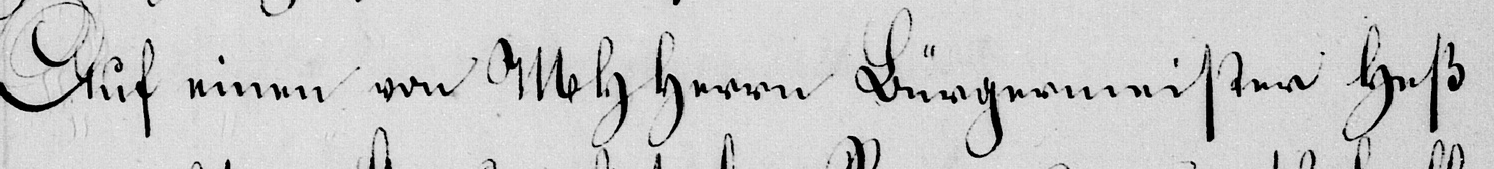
Auf einen von MHHerrn Bürgermeister Heß
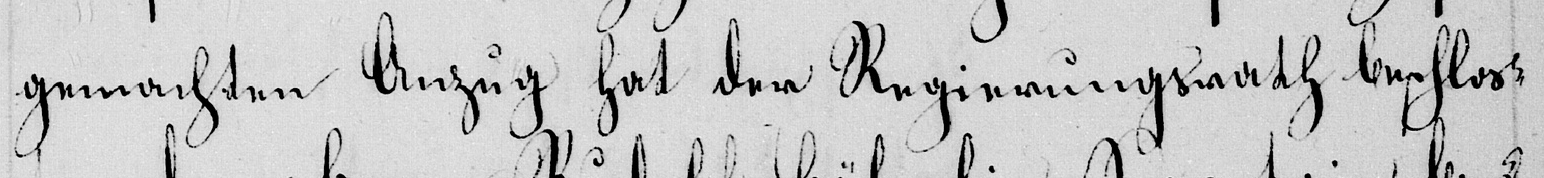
gemachten Anzug hat der Regierungsrath beschloß¬
